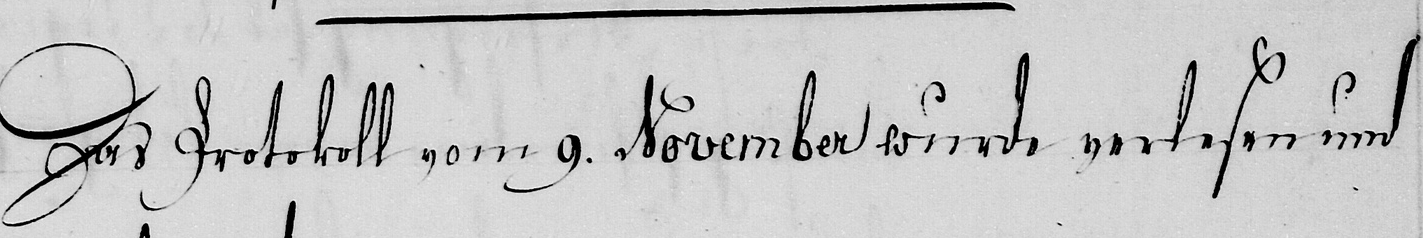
Das Protokoll vom 9. November wurde verlesen und
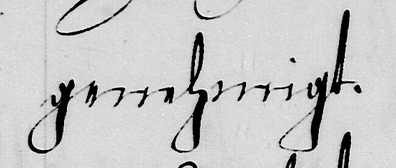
genehmigt.
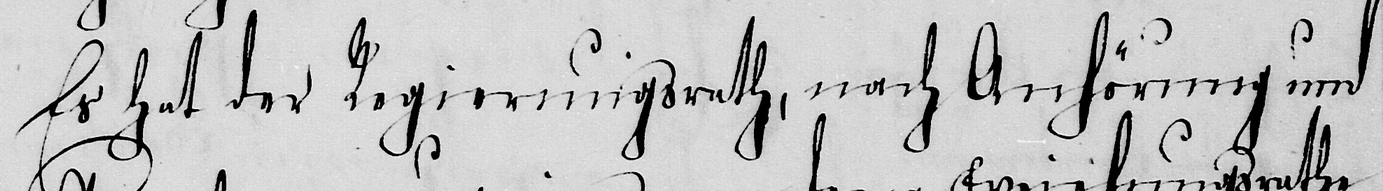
Es hat der Regierungsrath, nach Anhörung und
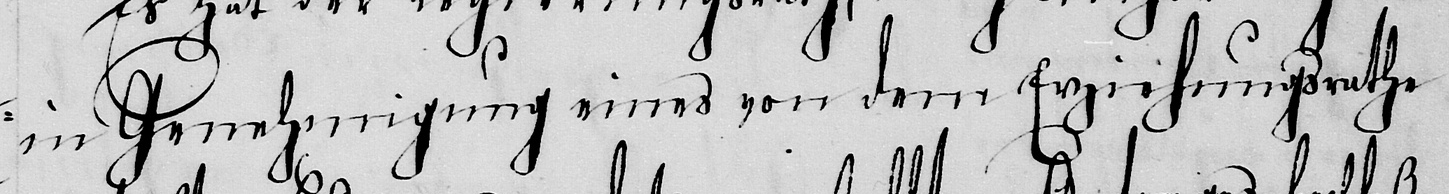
in Genehmigung eines von dem Erziehungsrathe
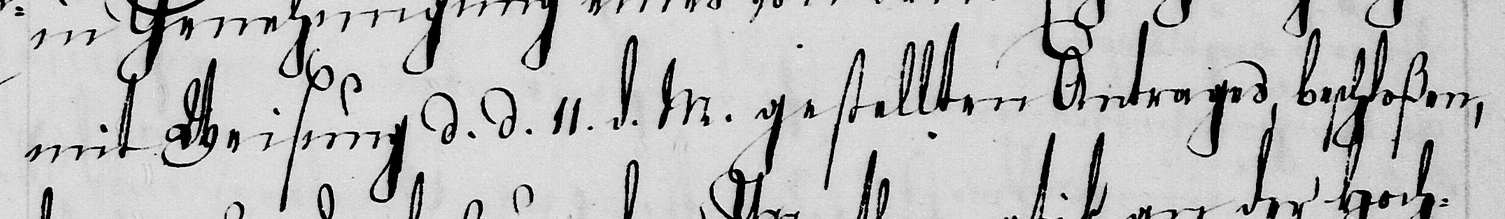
mit Weisung d. d. 11. d. M. gestellten Antrages, beschloßen,
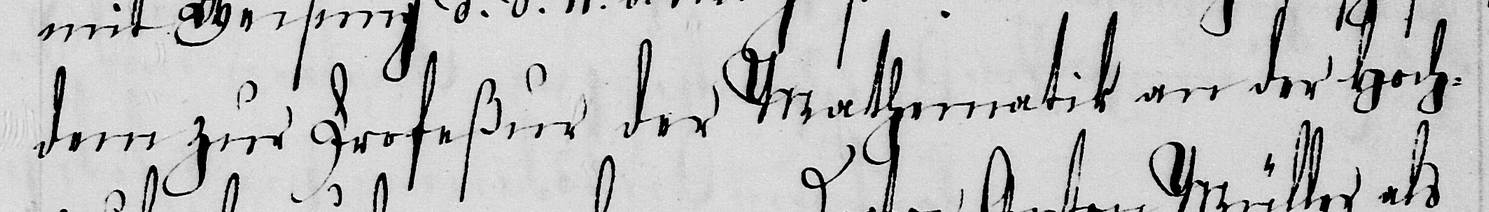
dem zur Profeßur der Mathematik an der Hoch¬
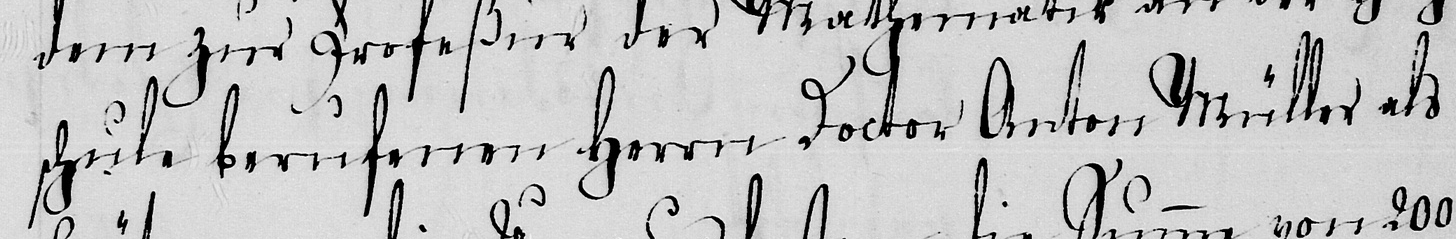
schule berufenen Herrn Doctor Anton Müller als
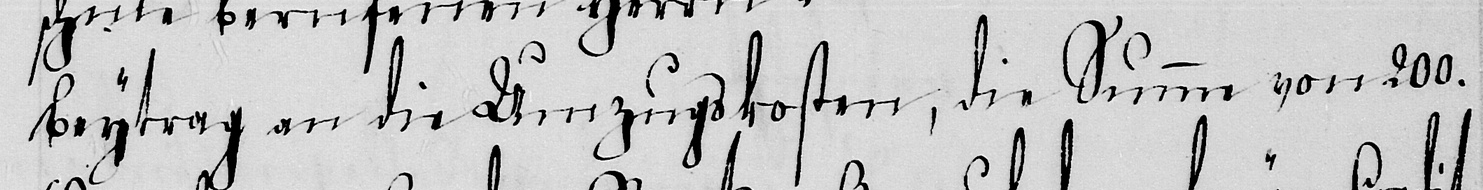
Beytrag an die Umzugskosten, die Summe von 200.
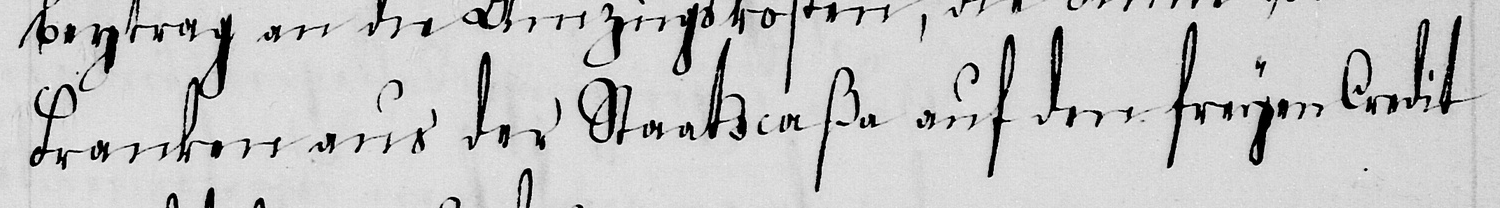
Franken aus der Staatscaßa auf den freyen Credit
